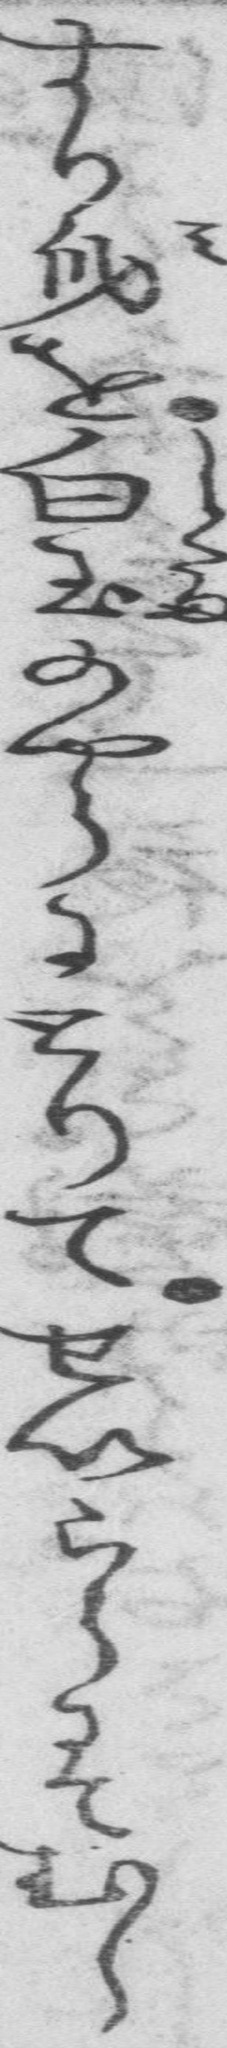すり身を。白玉のやうにとりて。せいらうにてむし
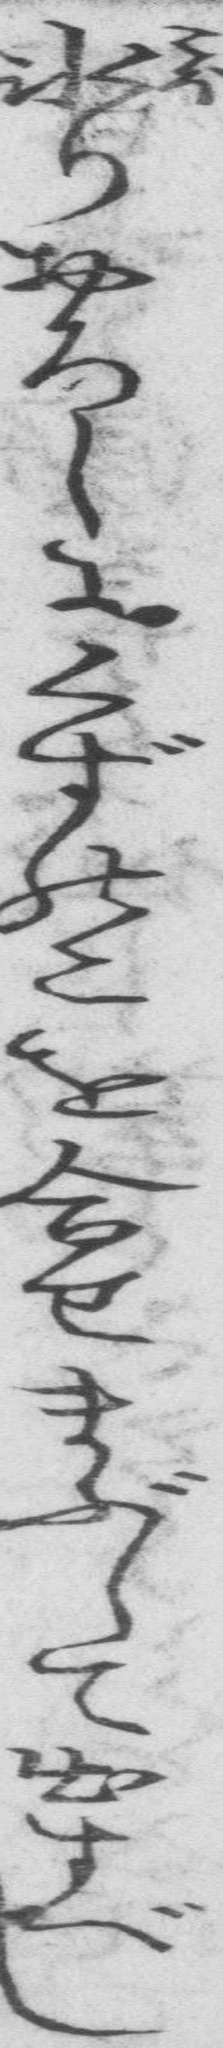氷りおろしに。くずのこを合せまぶして出すべし
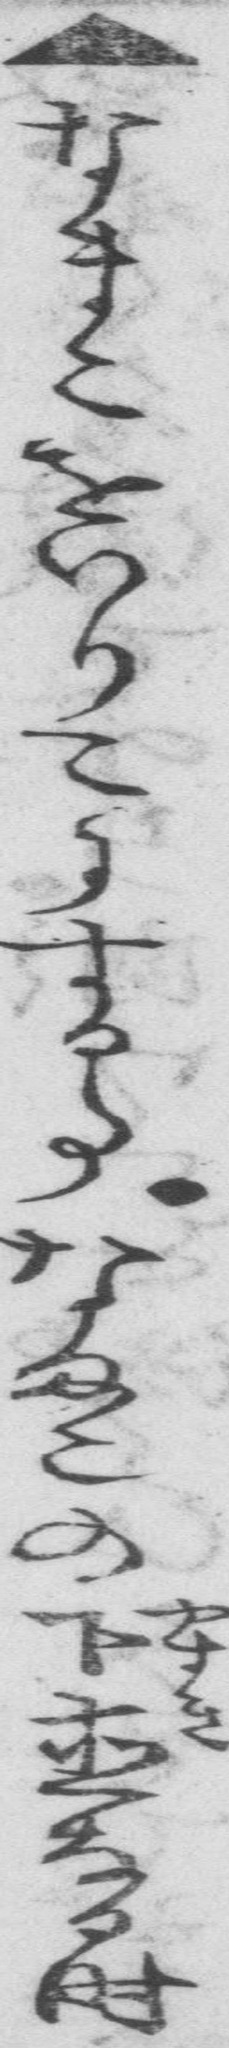▲なまこをいりこにする事。なまこの下直なる時
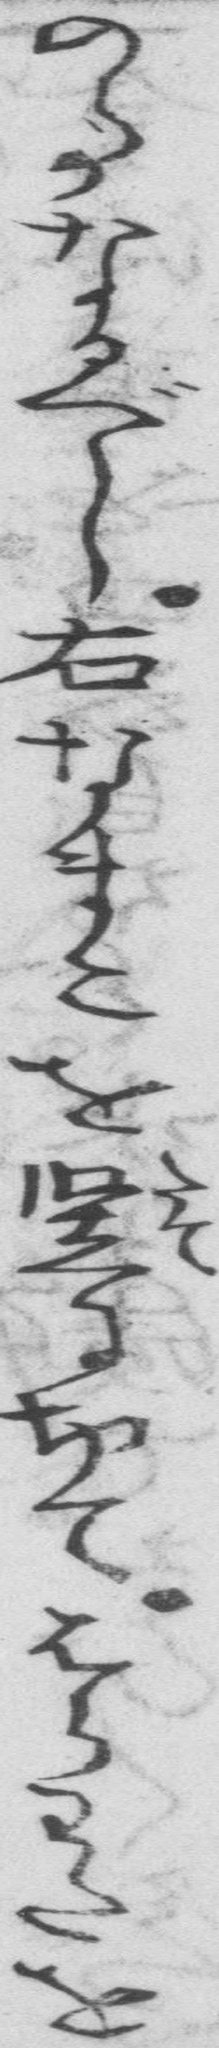の事なるべし。右なまこを竪に切て。はらわたを
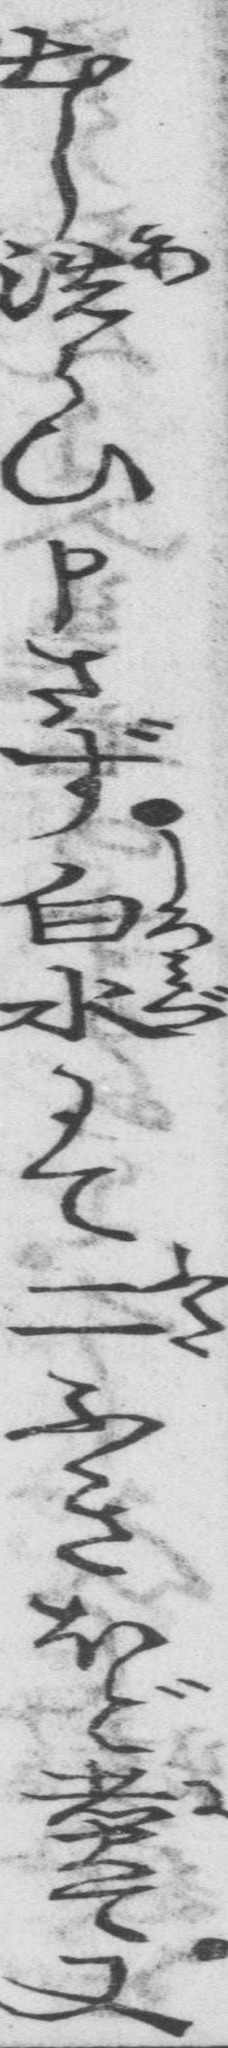出し洗らひ申さず。白水にて二ふきほど煮て。又
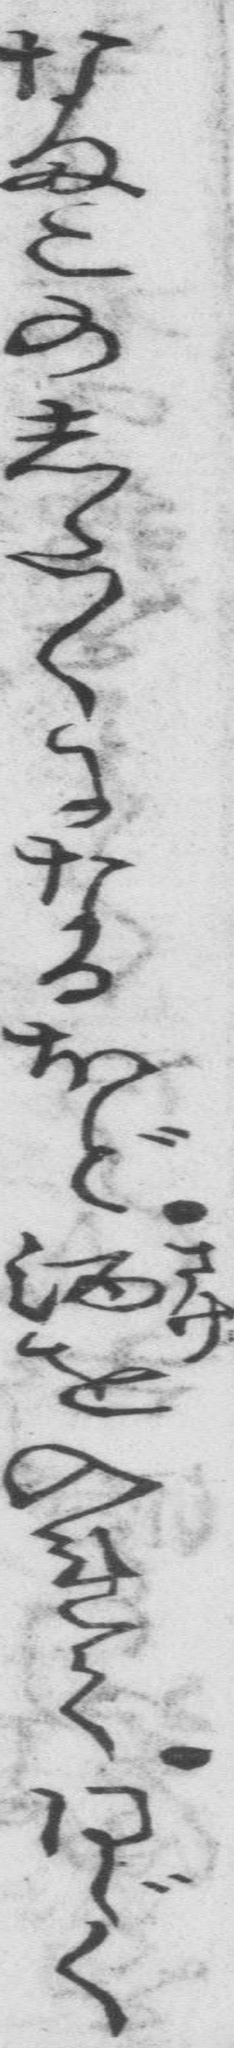なまこのした〳〵になるほど。酒を入れて。同じく
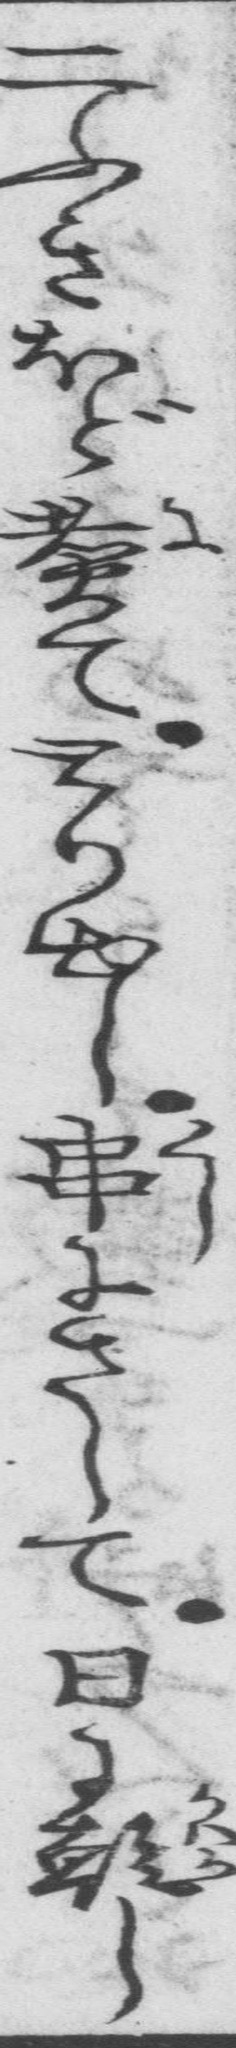二ふきほど煮て。とり出し。串にさして。日に乾し
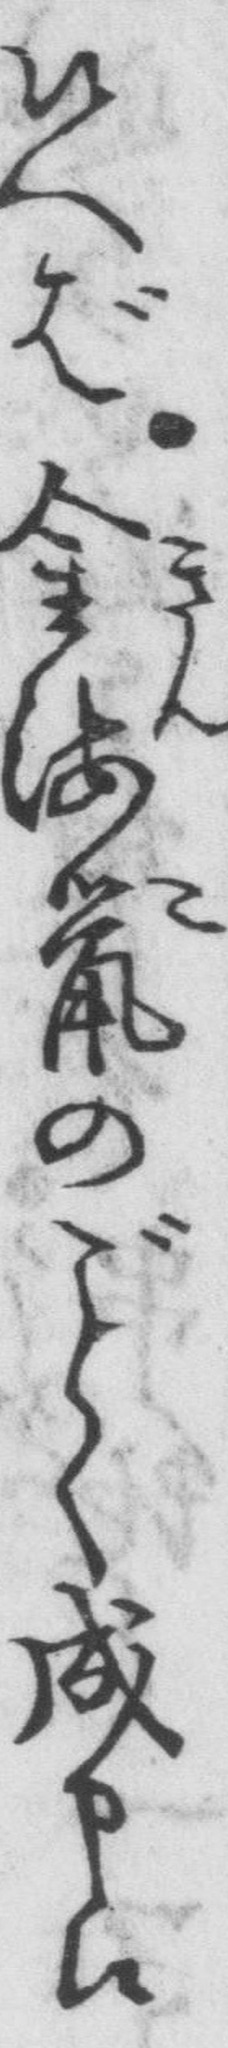候へば。金海鼠のごとく成申候
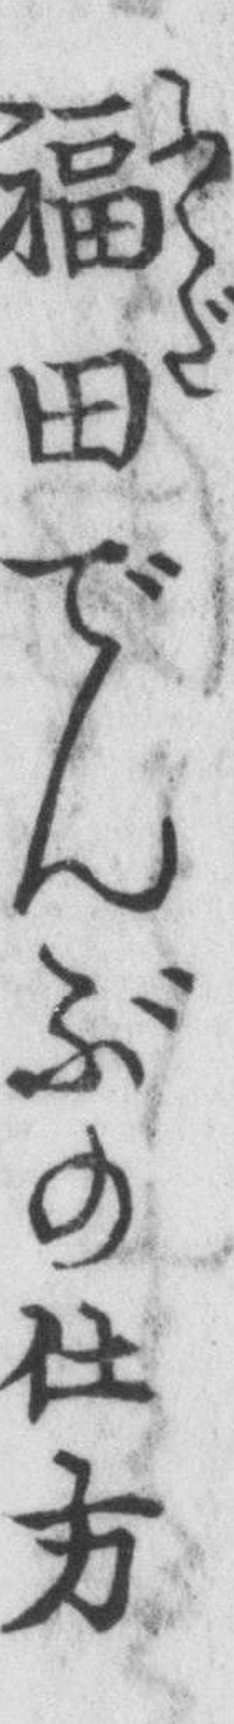福田でんぶの仕方
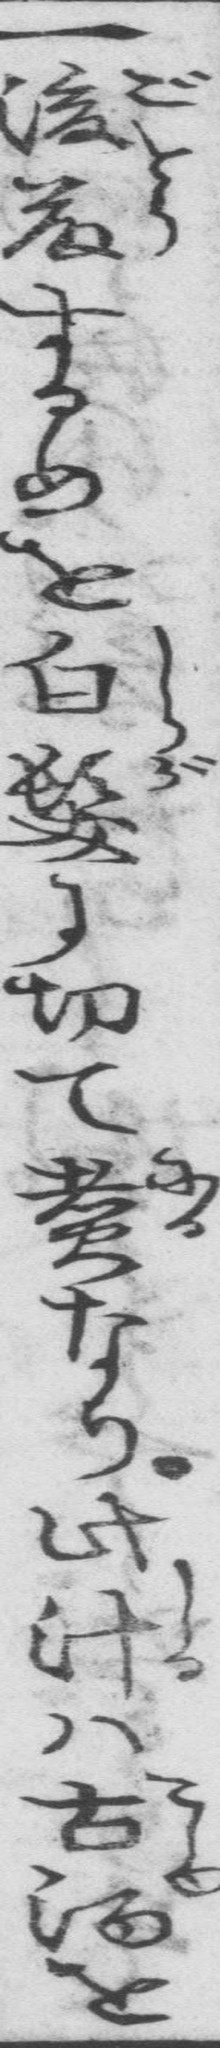一後藤するめを白髪に切て煮なり。此汁は古酒を
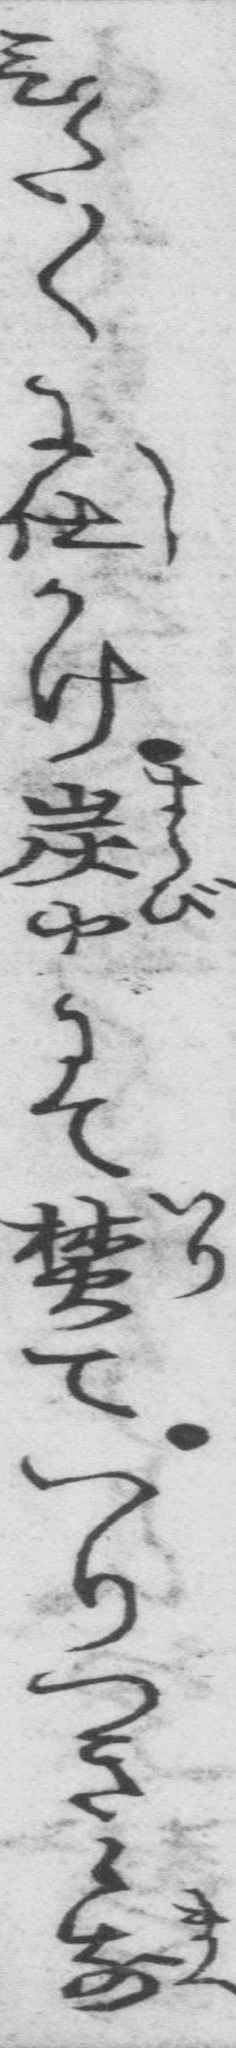ひた〳〵に仕かけ。炭火にて。焚て。いりつき候前
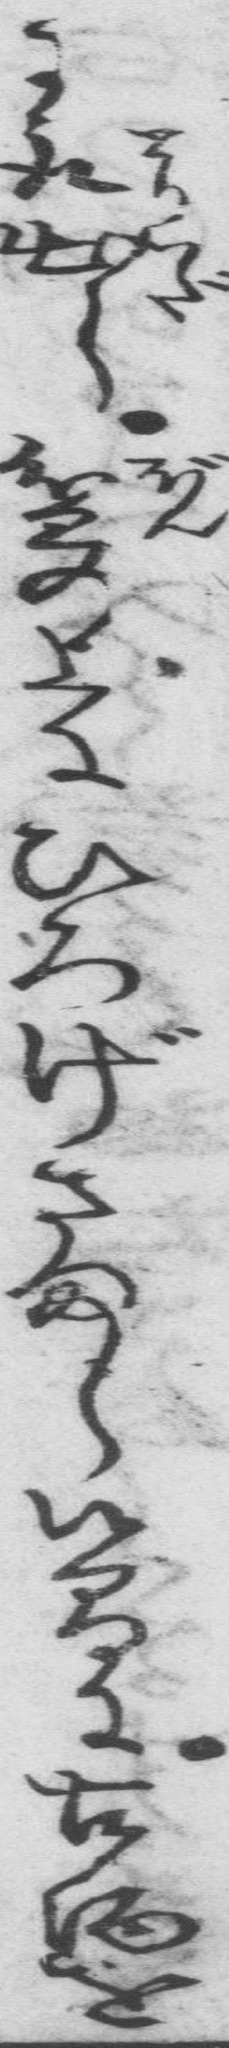に取出し。盆の上にひろげさまし候間に。古酒を
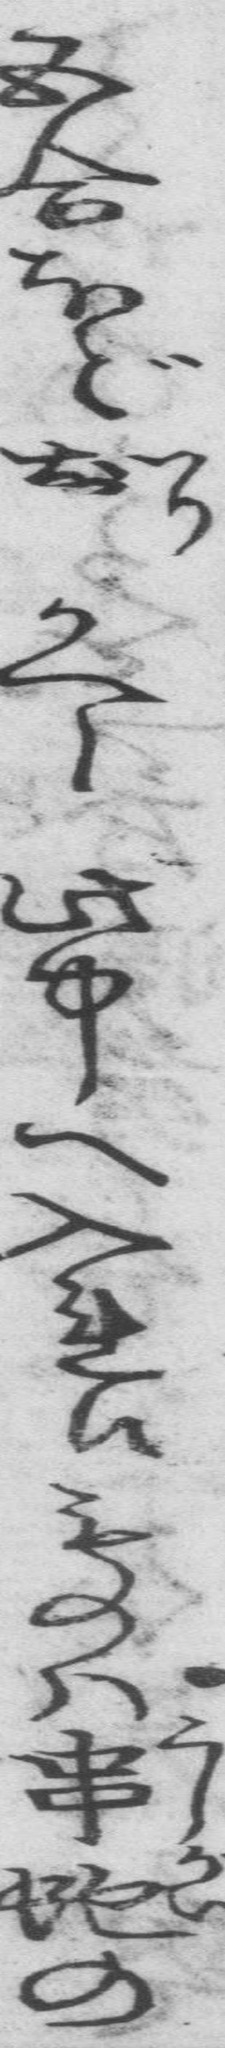五合ほど煎かへし此中へ入れ候ものは。串鮑の

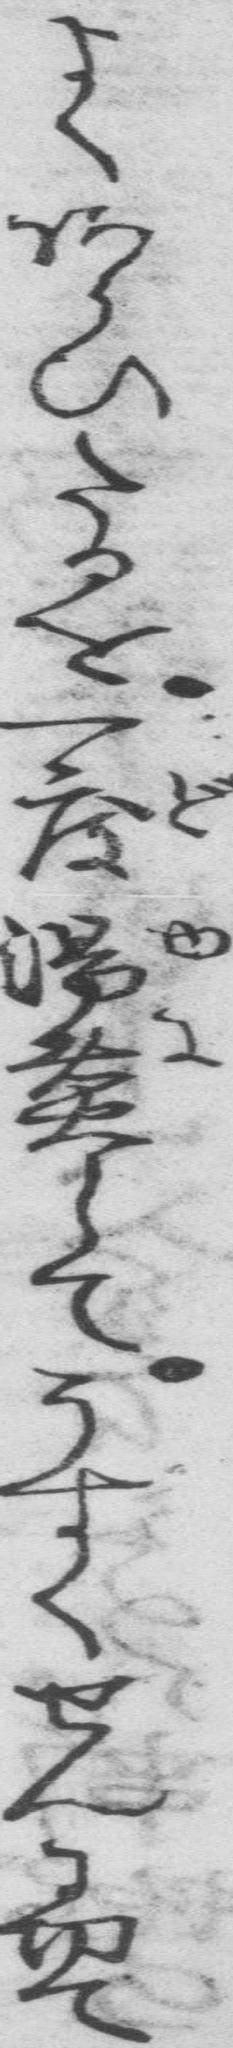よくあらひたるを。一度湯煮して。うすくせんに切て
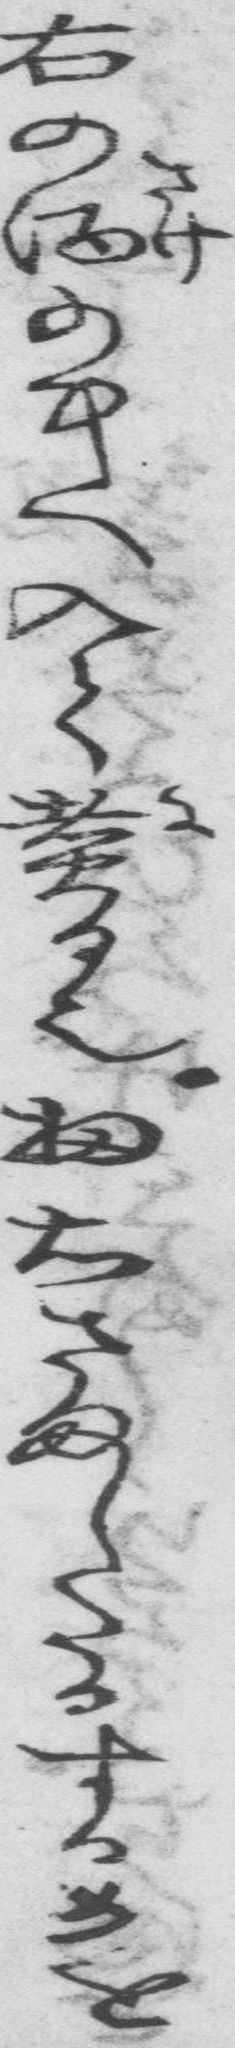右の酒の中へ入て煮る也。扨右さましたるするめを
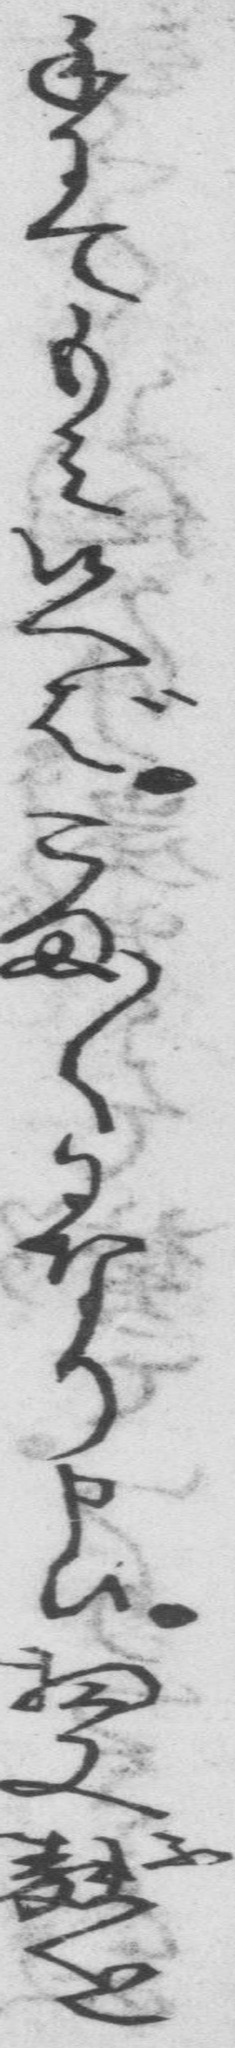手にてもみ候へば。こま〳〵になり申候。扨又麩を
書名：萬寳料理秘密箱
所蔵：大阪府立大学学術情報センター 国文学研究資料館
